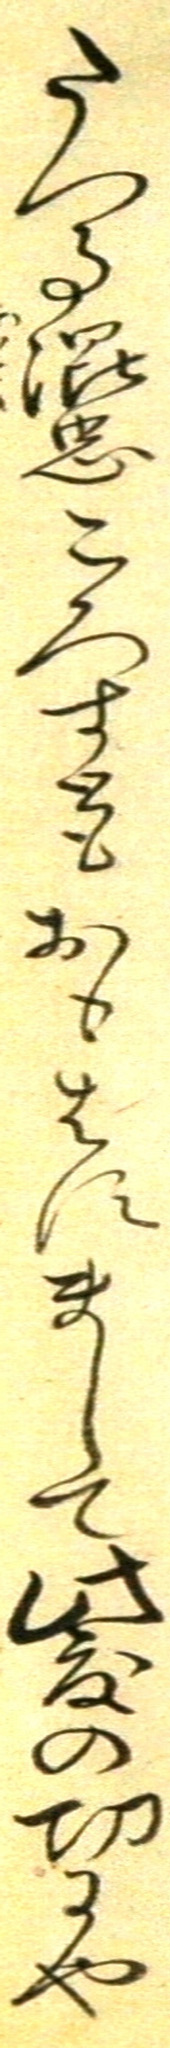たつ事混忠ころすともおもはすまして此度の功にや

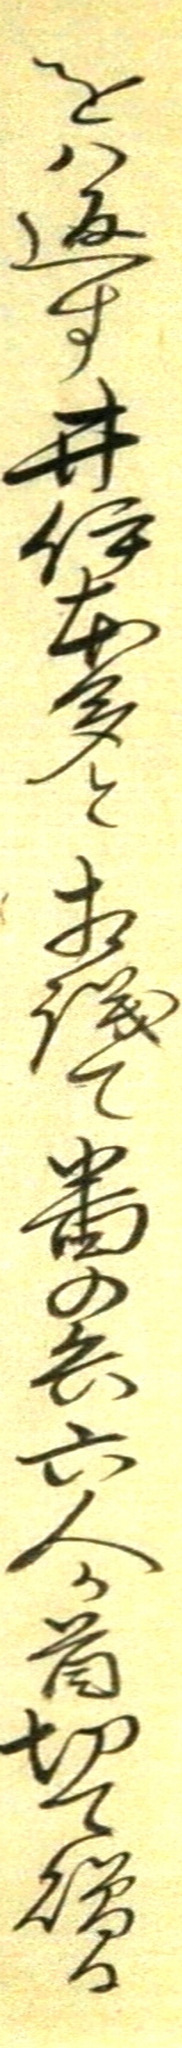をは返す井伊本多と相議て番の兵六人か首切て贈る
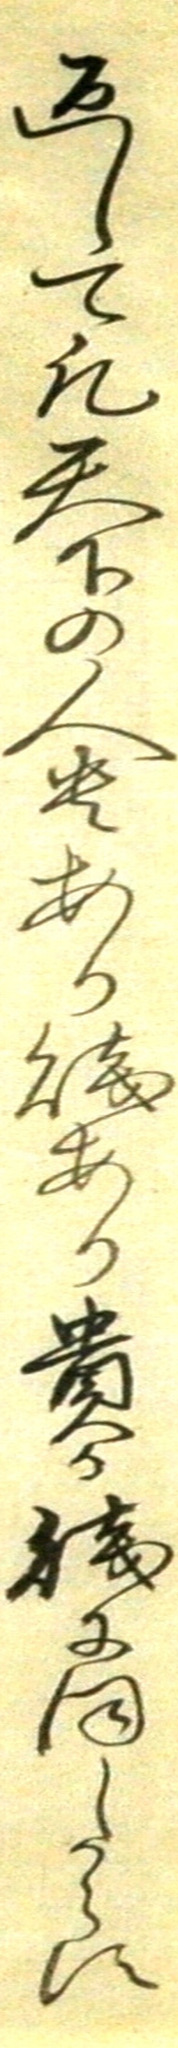返して凡天下の人貴あり賎あり貴か賤に同ししたらす
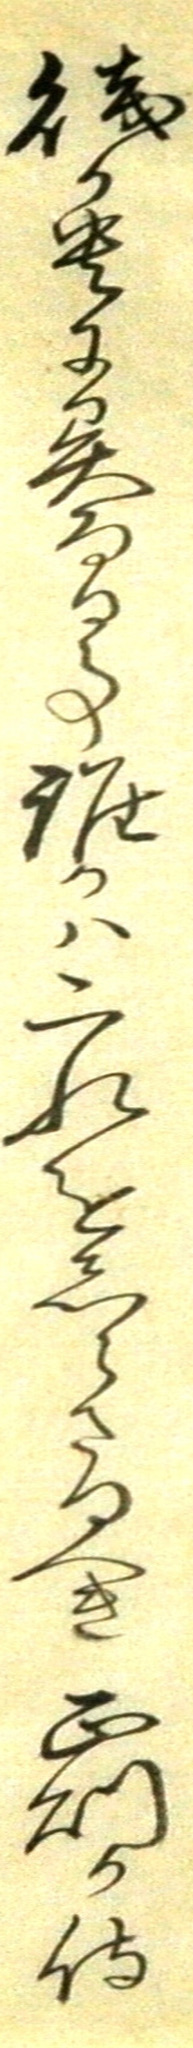賤か貴に異なる事誰かはここれをしらさるへき正則か侍
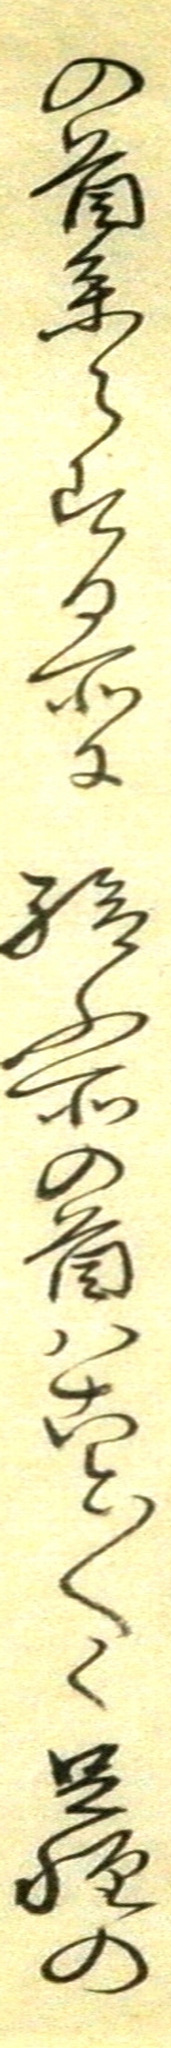の首参らする所に給ふ所の首はこと〳〵く足軽の
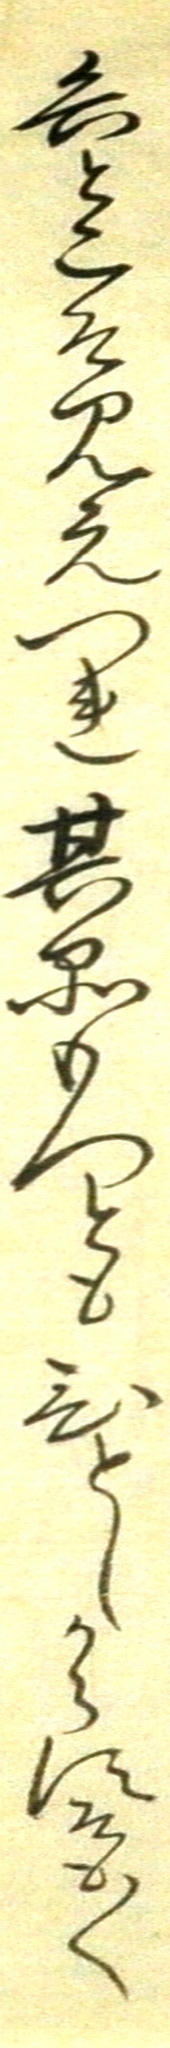兵とこそ見えつれ其品もつともひとしからすそも〳〵
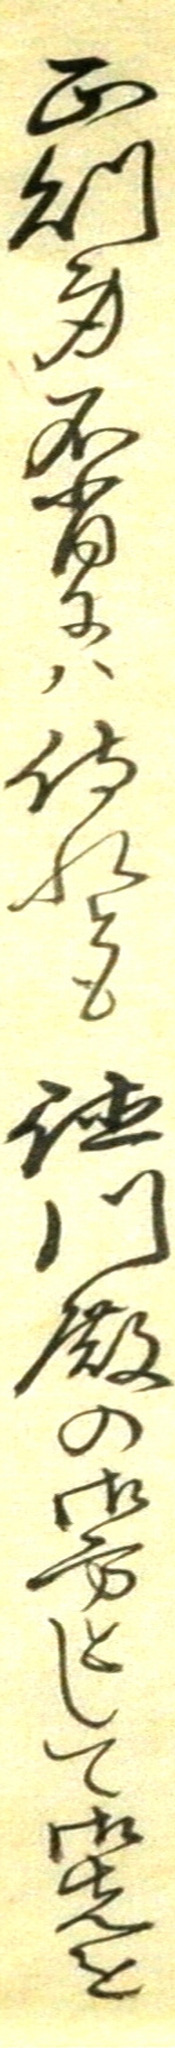正則身不肖には侍れとも徳川殿の御方として御先を
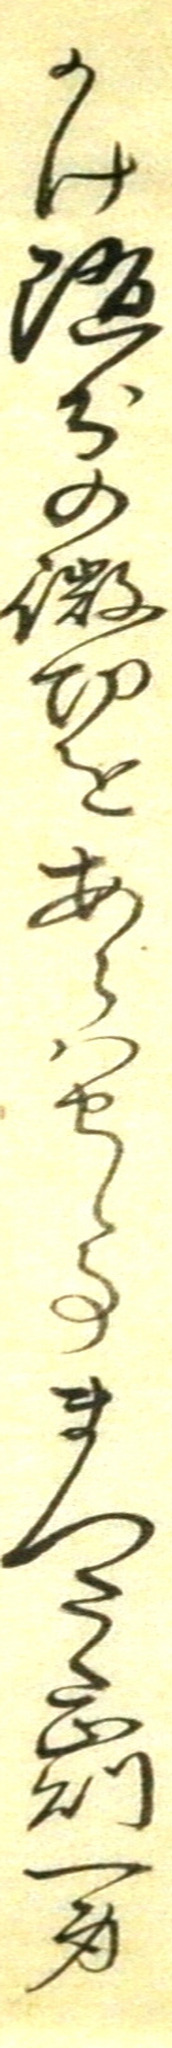かけ随分の微功をあらはせし事まつこた正則一身
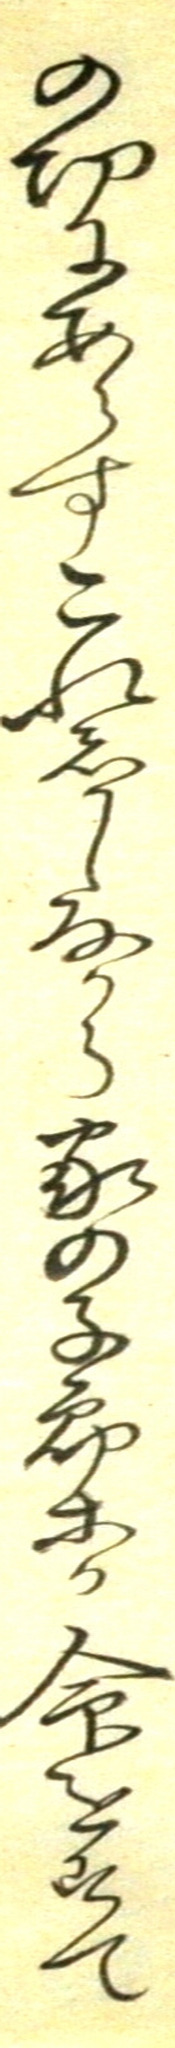の功にあらすこれしかしなから家の子郎等か命をすて
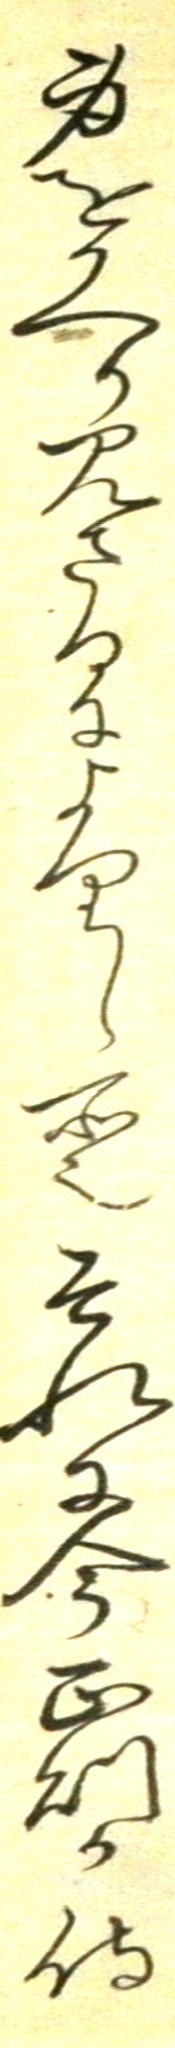身をかへり身さるによりし所也それに今正則か侍
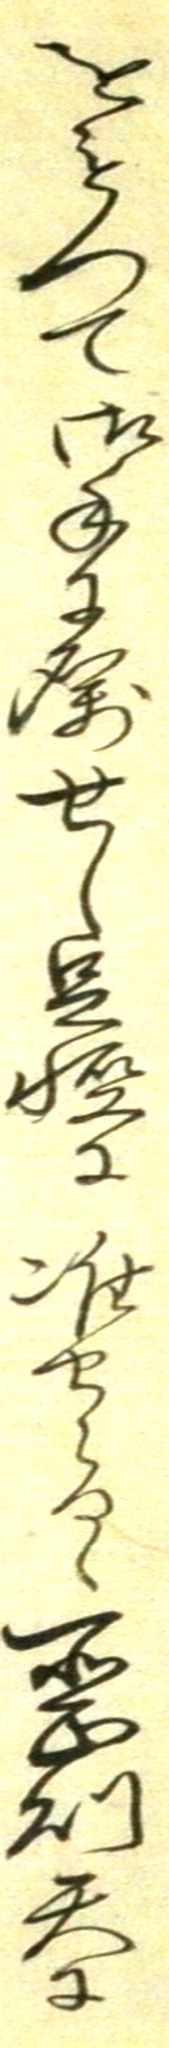をもつて御手に属せし足軽に准せらるゝ所正則天に
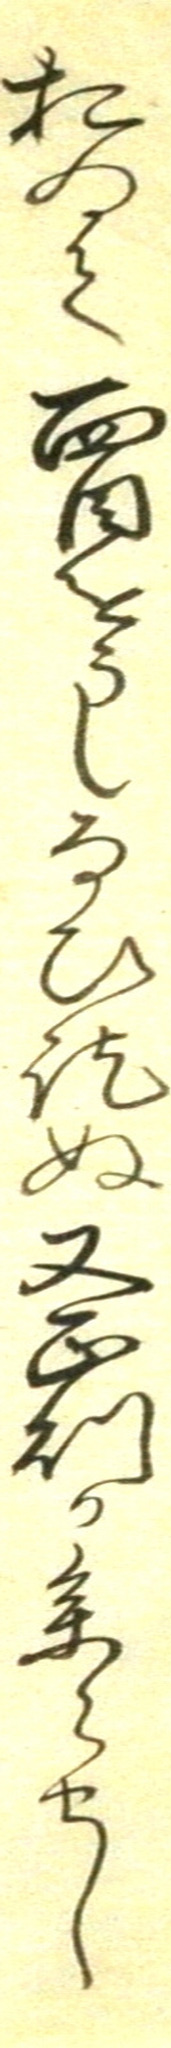おゐて面目をうしなひ訖ぬ又正則か参らせし
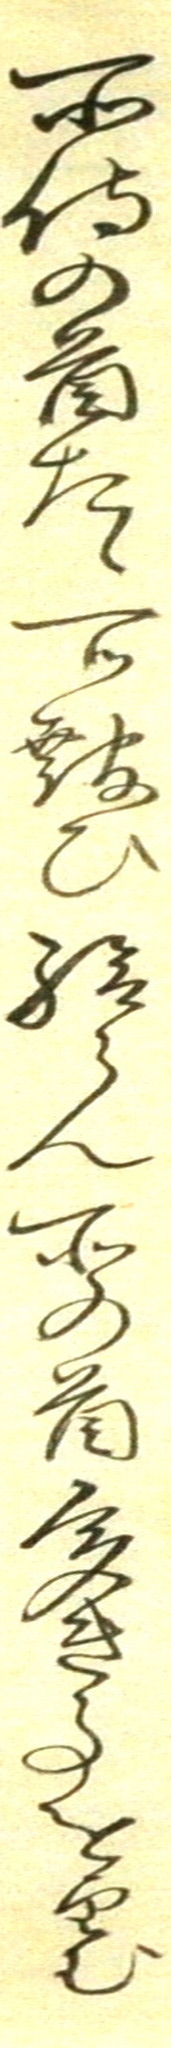所侍の首たゝ一つ報ひ給らん所の首多き事を望む
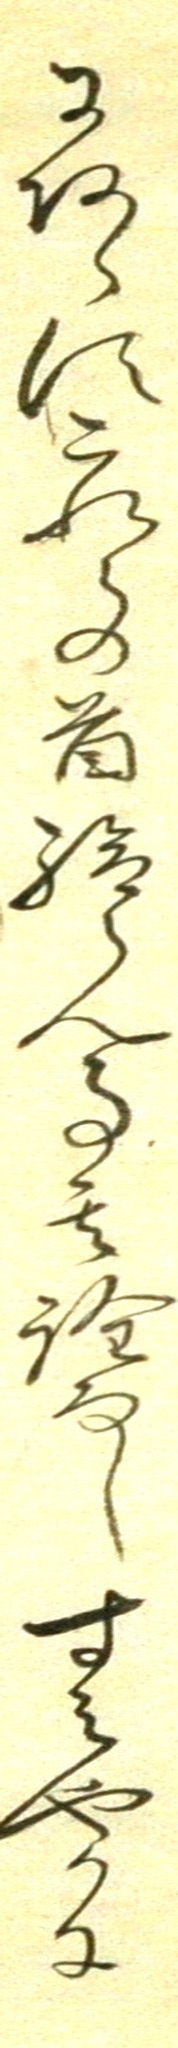にあらすこれらの首給らん事其詮なしすみやかに
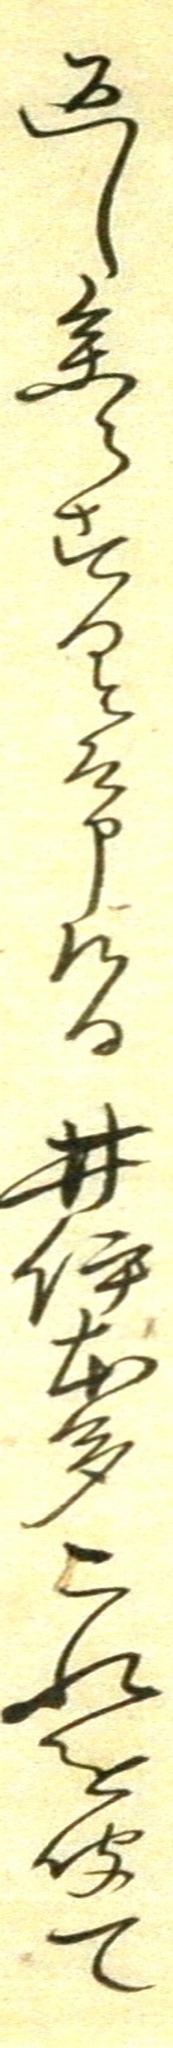返し参らするとそ申ける井伊本多これを聞て
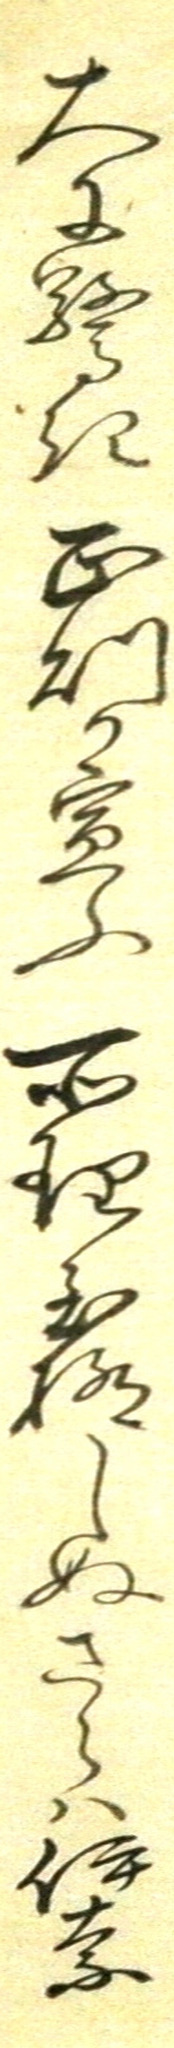大に驚き正則か宣ふ所理至極しぬさらは伊奈
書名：藩翰譜（十二・上）
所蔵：伊那市立高遠町図書館・合同会社AMANE
